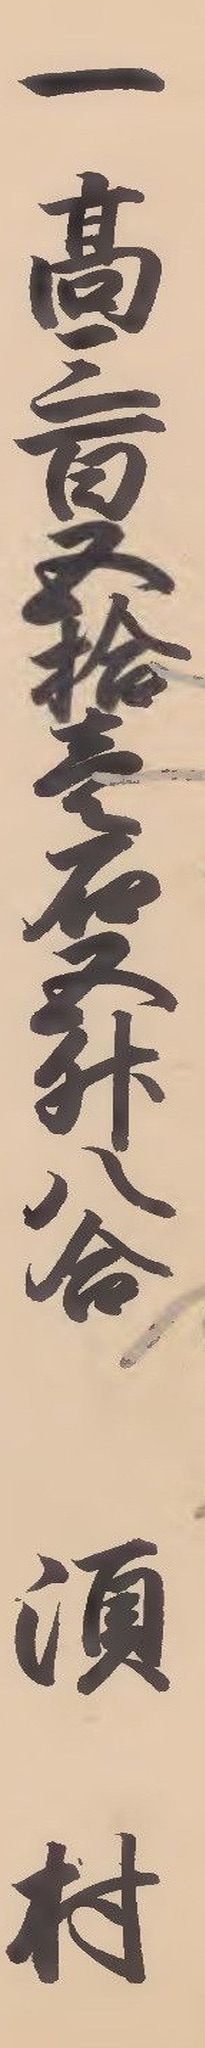一高三百五拾壱石五升八合須村
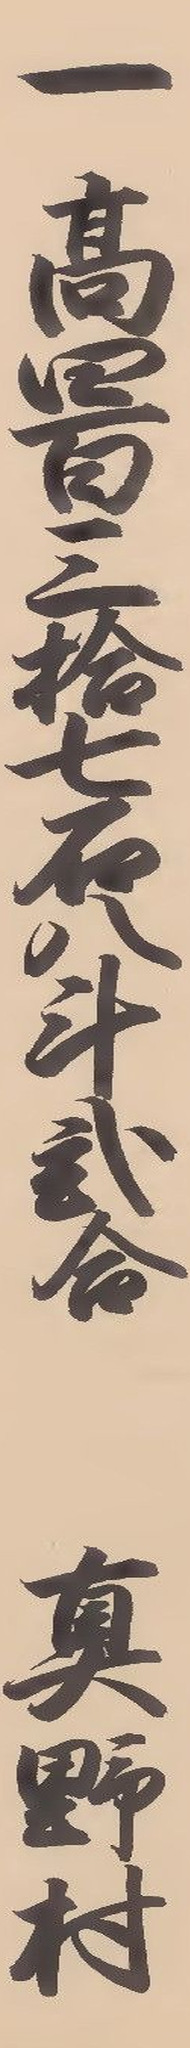一高四百三拾七石八斗弐合真野村
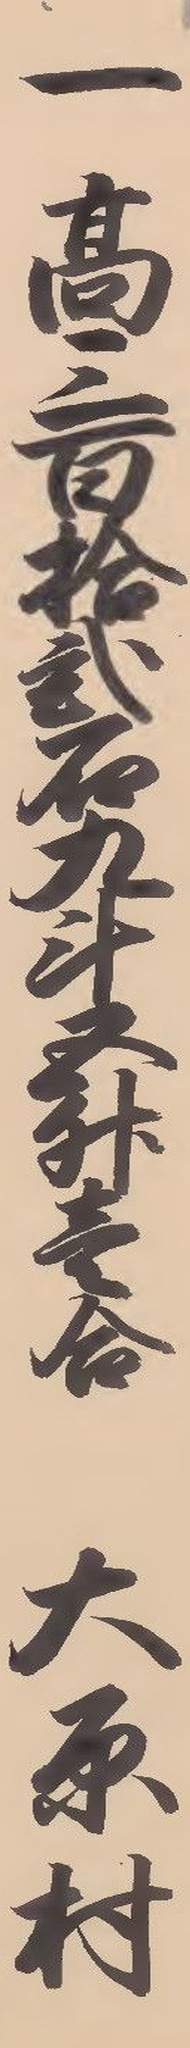一高三百拾弐石九斗五升壱合大原村
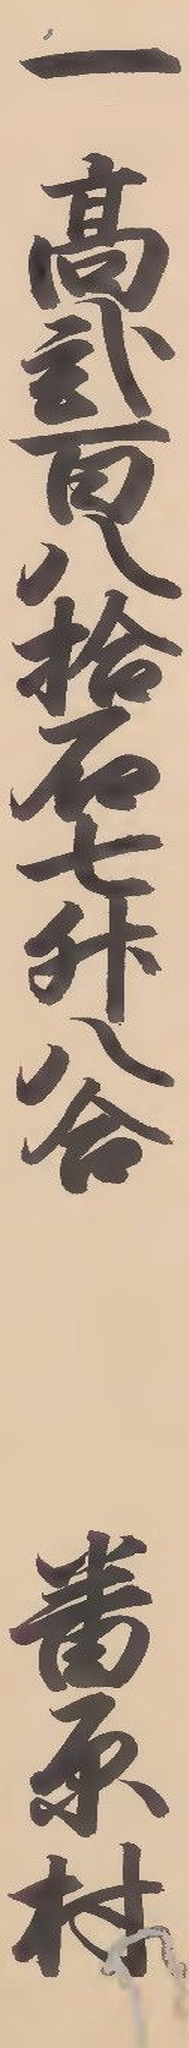一高弐百八拾石七升八合番原村
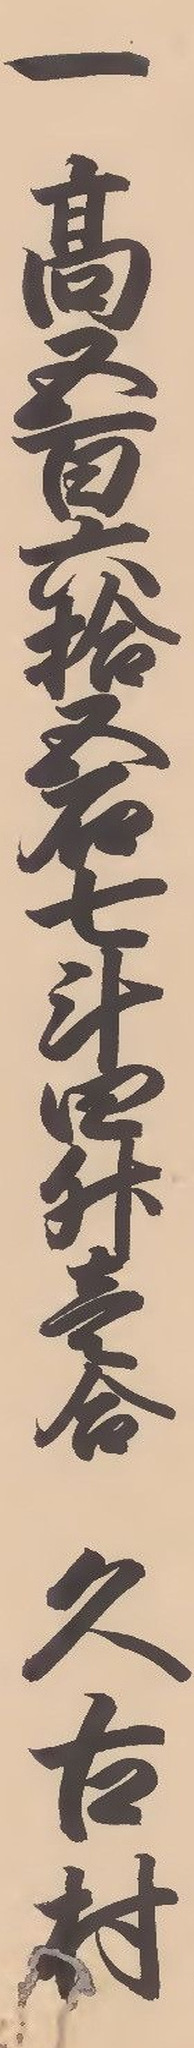一高五百六拾五石七斗四升壱合久古村
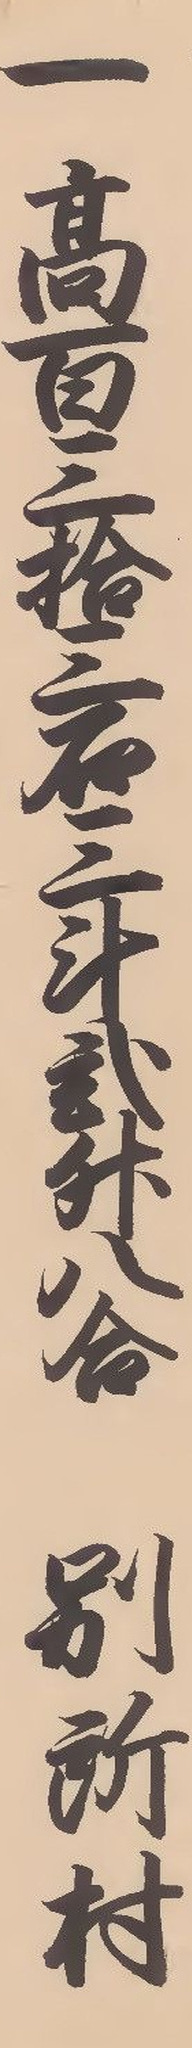一高百三拾三石三斗弐升八合別所村
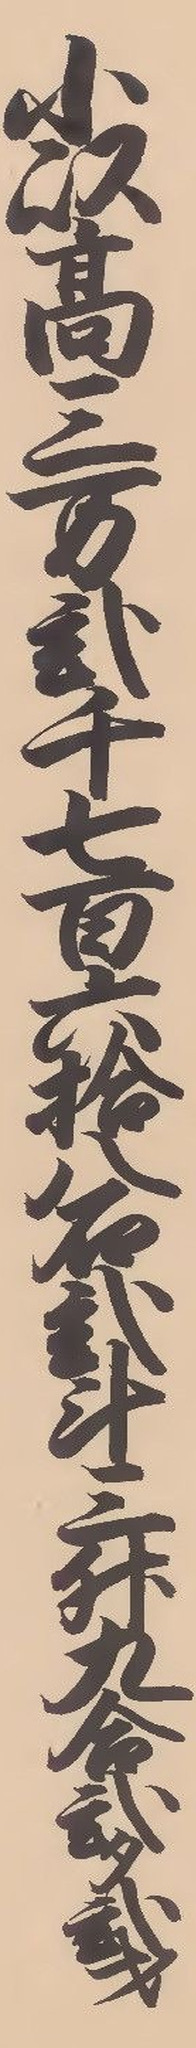小以高三万弐千七百六拾八石弐斗三升九合弐勺弐才

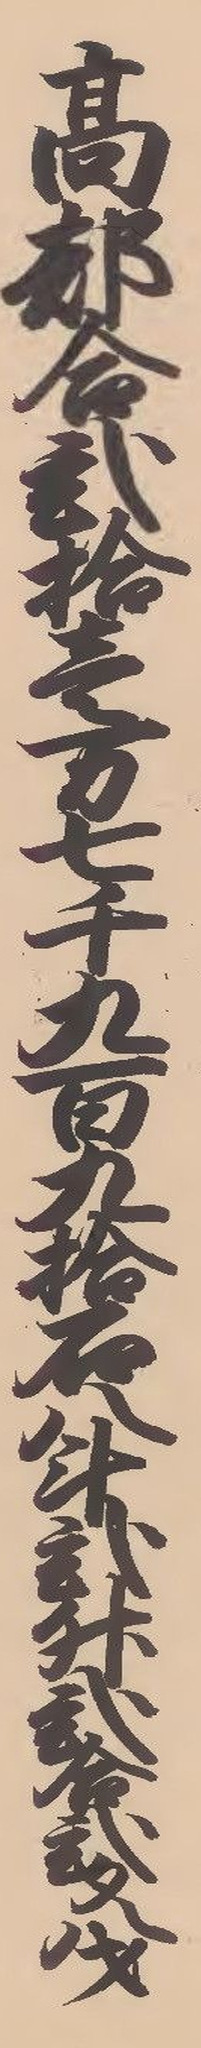高都合弐拾壱万七千九百九拾石八斗弐升弐合弐勺八才
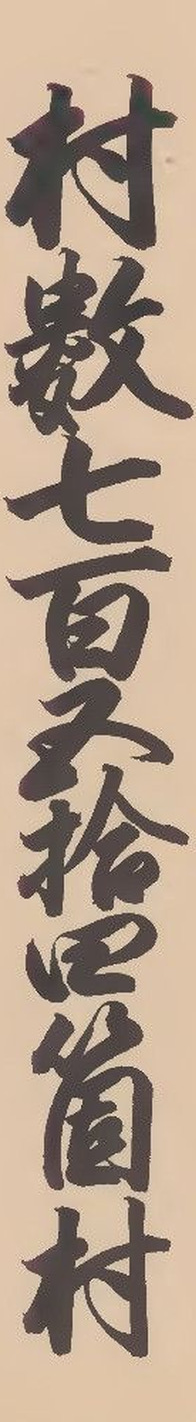村数七百五拾四箇村
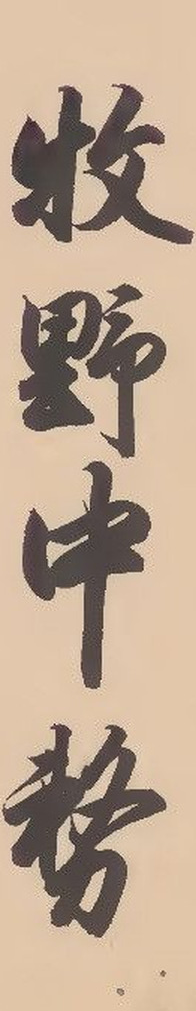牧野中務
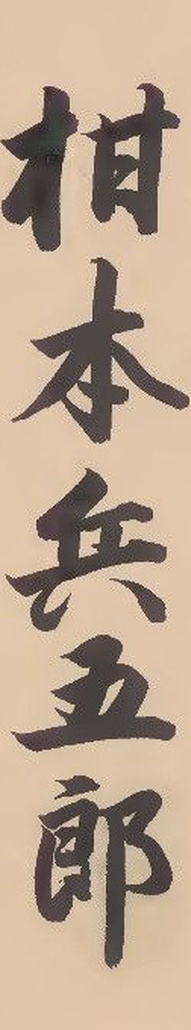柑本兵五郎
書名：伯耆国郷帳
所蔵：国立公文書館 National Archives of Japan
